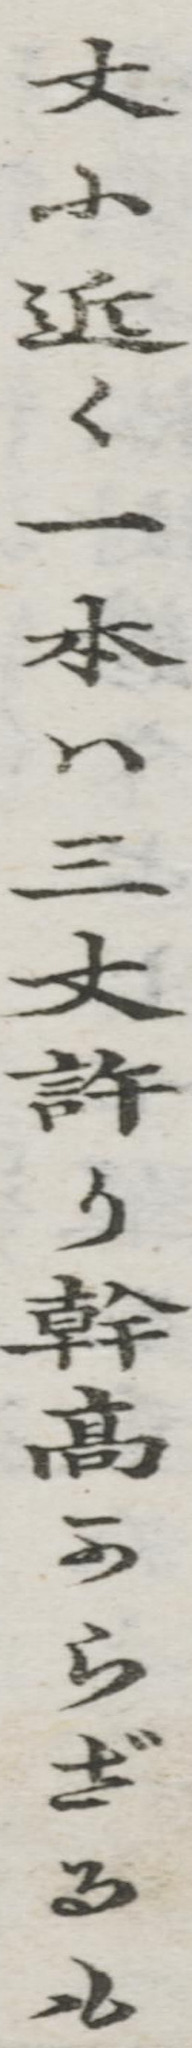丈に近く一本は三丈許り幹高からざるも
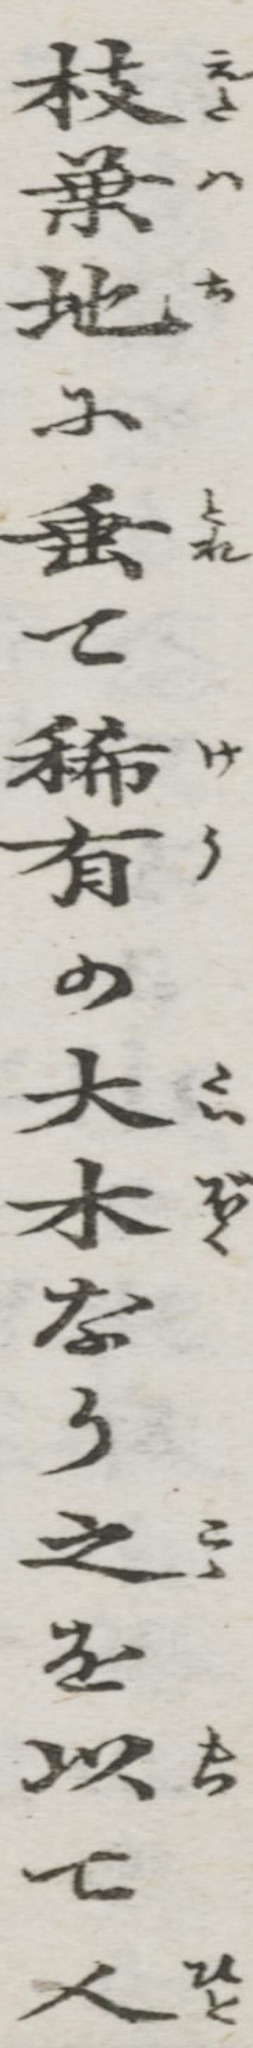枝葉地に垂て稀有の大木なり之を以て人
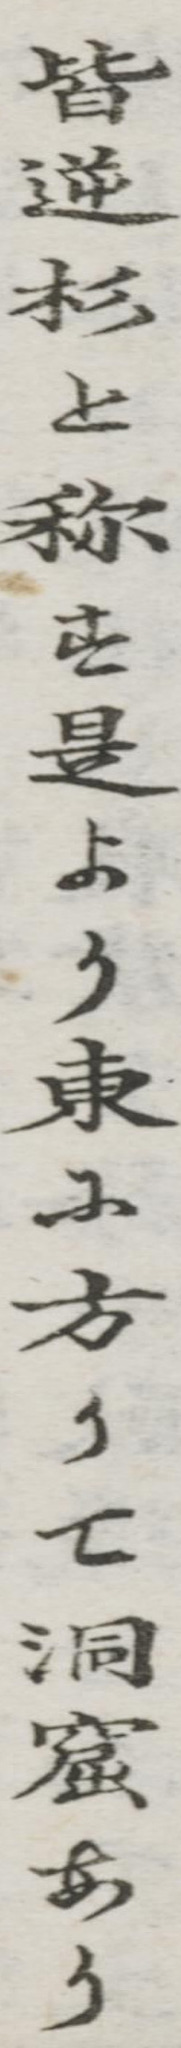皆逆杉と称す是より東に方りて洞窟あり
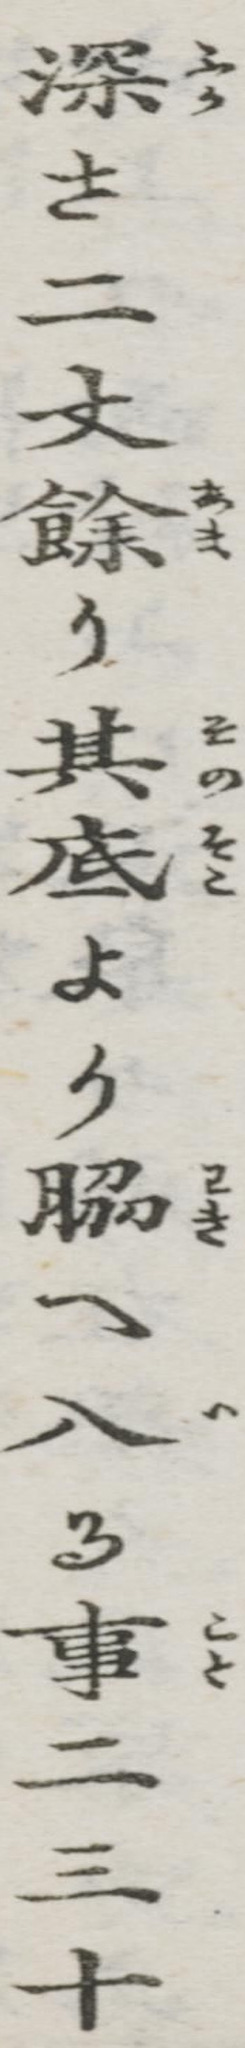深さ二丈餘り其底より脇へ入る事二三十
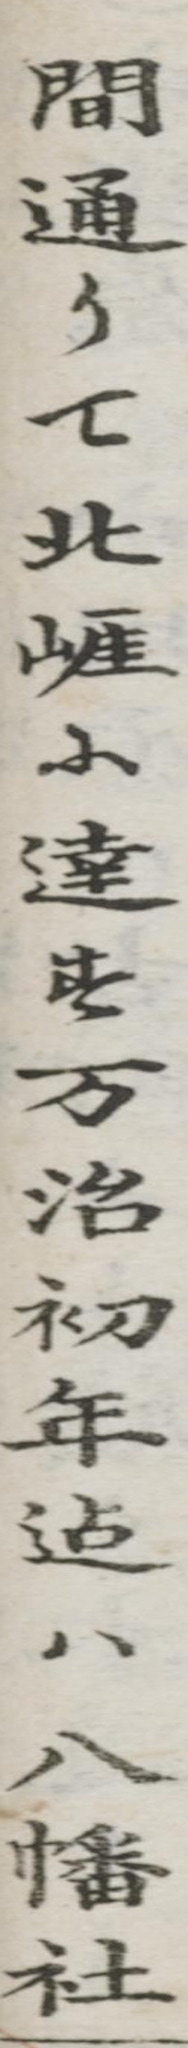間通りて北崖に達す万治初年迠は八幡社
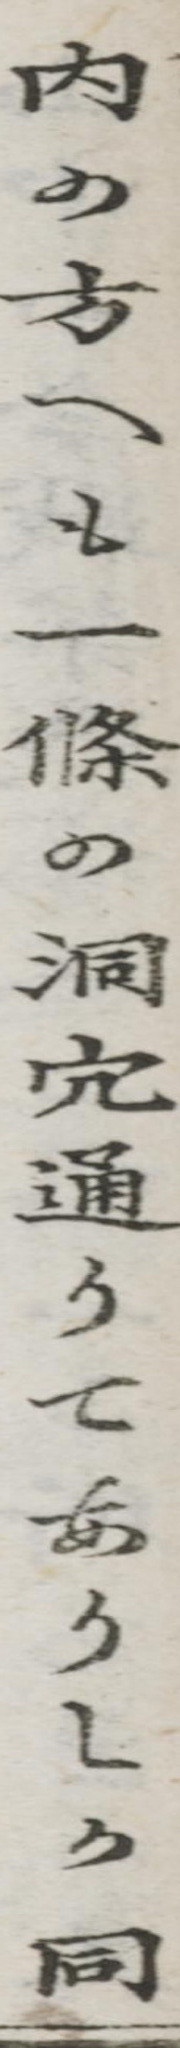内の方へも一條の洞穴通りてありしか同
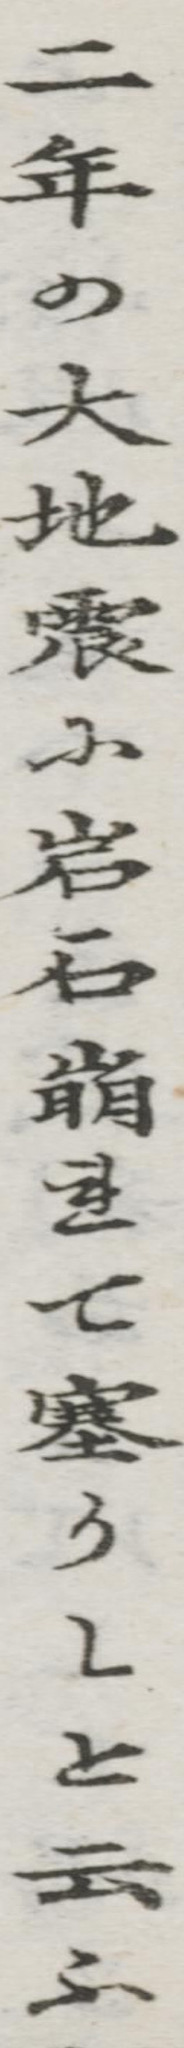二年の大地震に岩石崩れて塞りしと云ふ
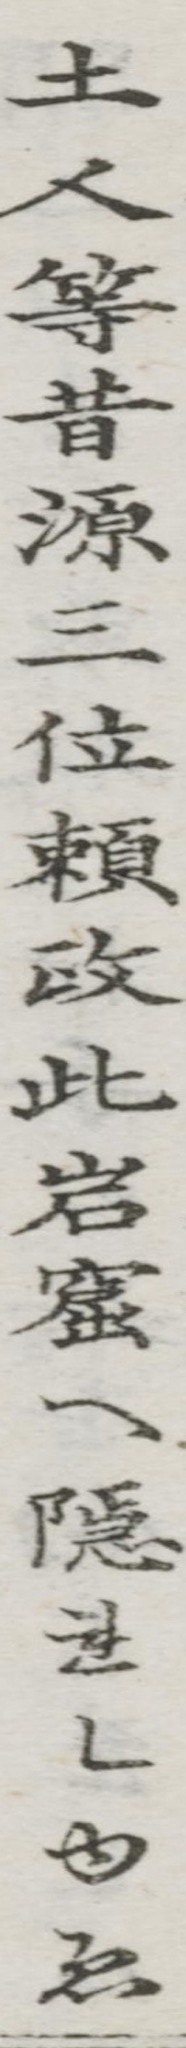土人等昔源三位頼政此岩窟へ隠れしゆゑ
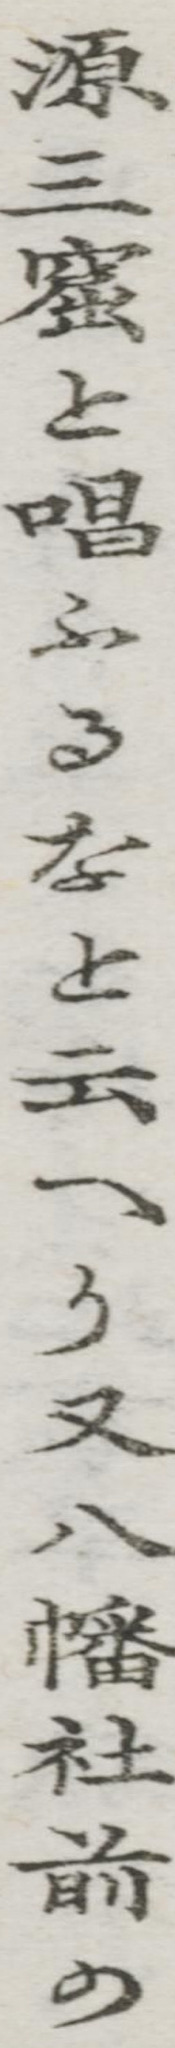源三窟と唱ふるなと云へり又八幡社前の
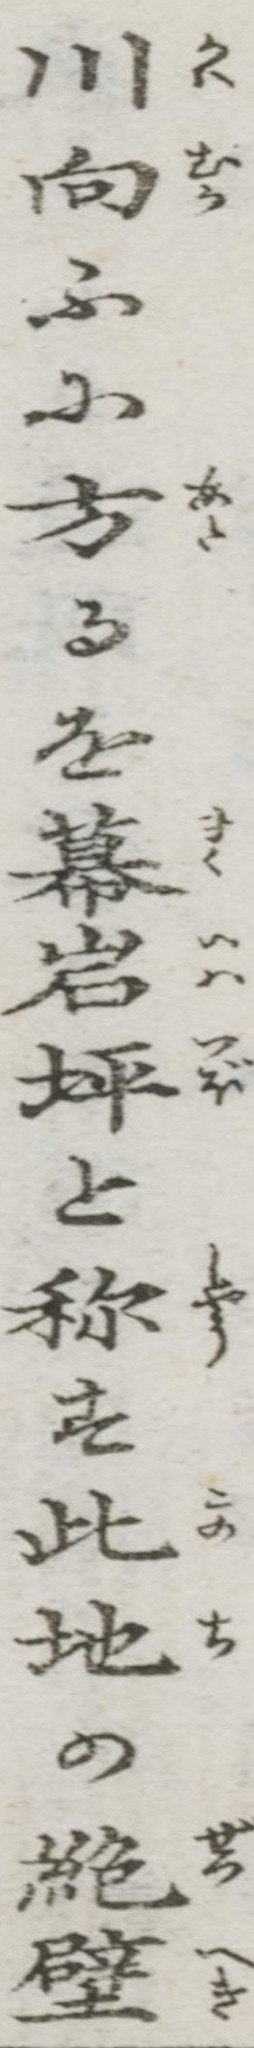川向ふに方るを幕岩坪と称す此地の絶壁
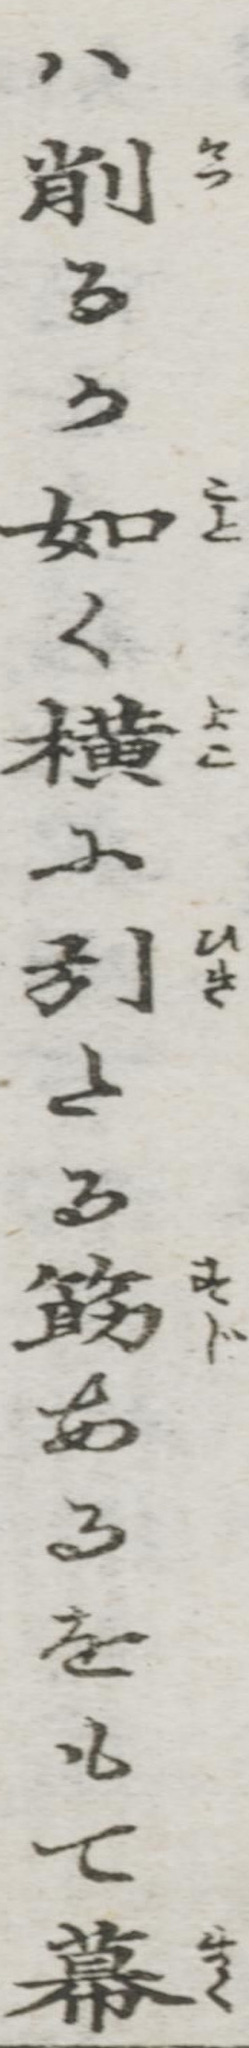は削るか如く横に引たる筋あるをもて幕
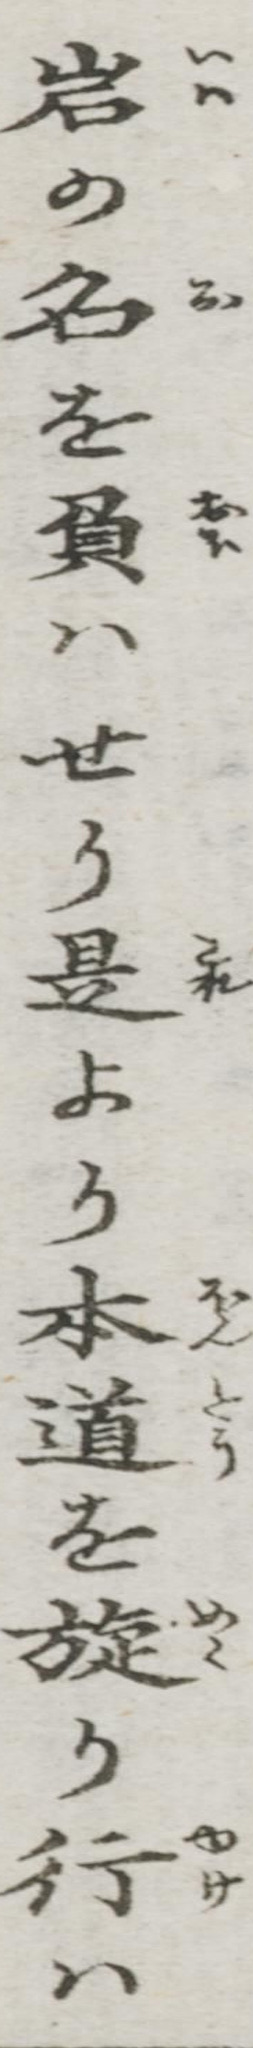岩の名を負はせり是より本道を旋り行は
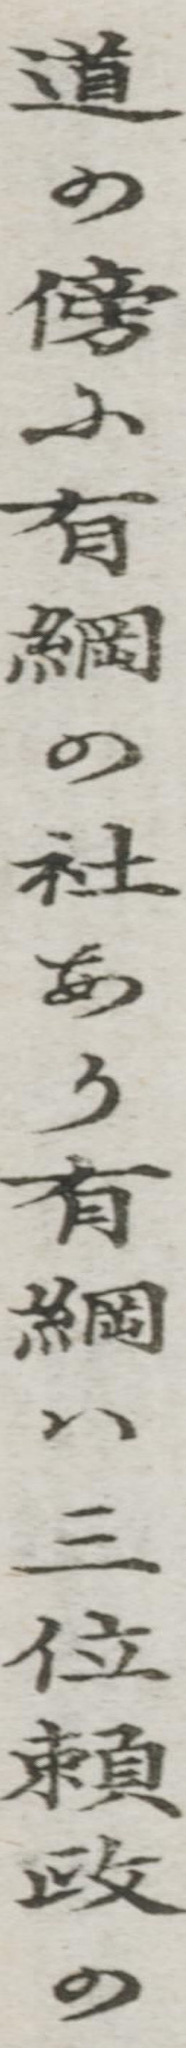道の傍に有綱の社あり有綱は三位頼政の

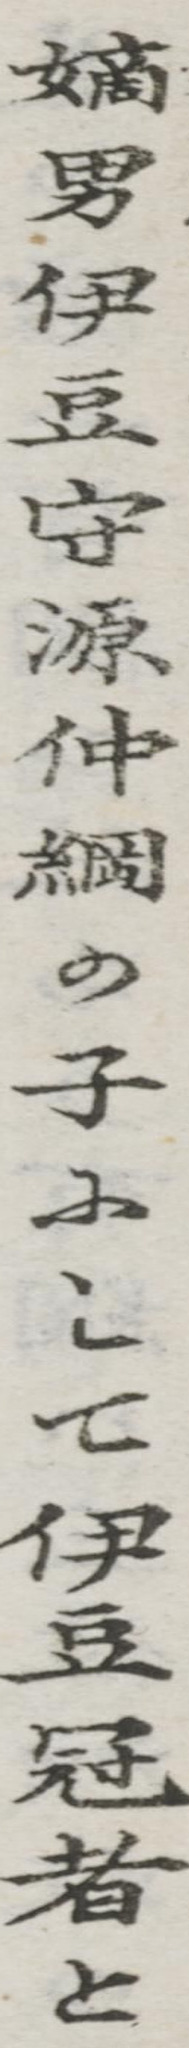嫡男伊豆守源仲綱の子にして伊豆冠者と
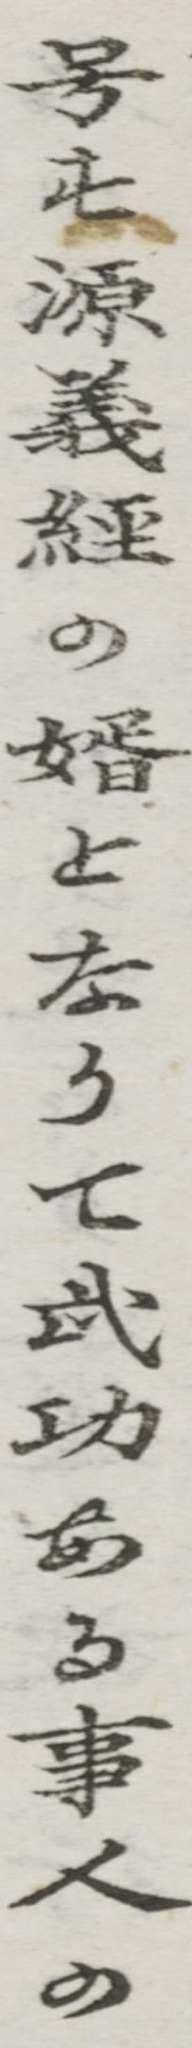号す源義経の婿となりて武功ある事人の
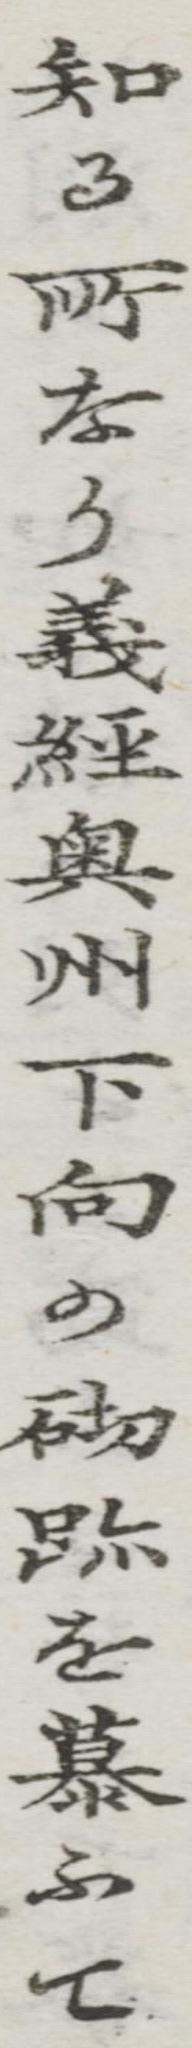知る所なり義経奥州下向の砌跡を慕ふて
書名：塩原繁昌記　全
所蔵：東京大学地震研究所図書室 Earthquake Research Institute Library, The University of Tokyo, JAPAN
